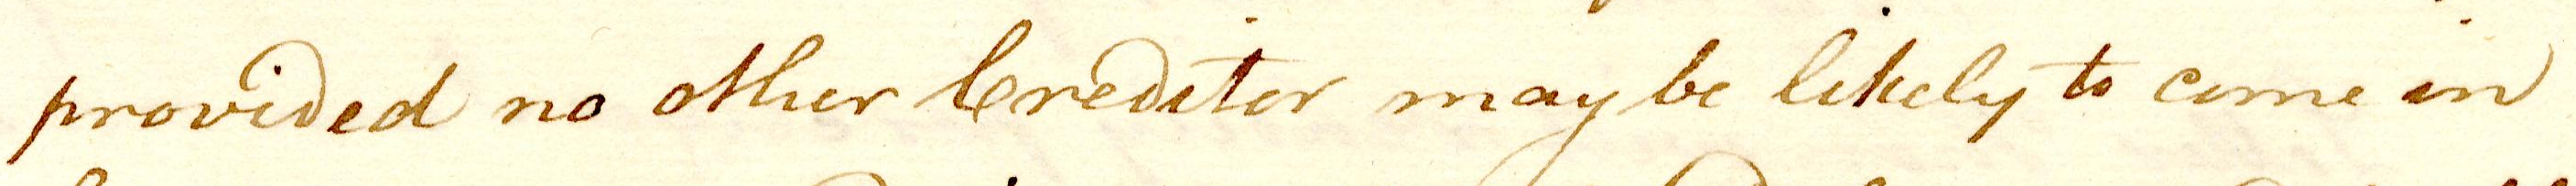provided no other Creditor may be likely to come in
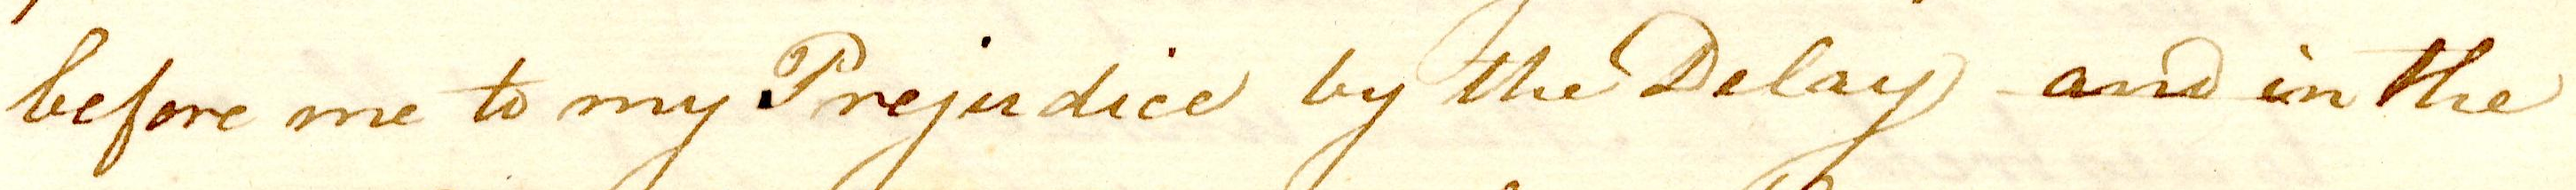before me to my Prejudice by the Delay and in the
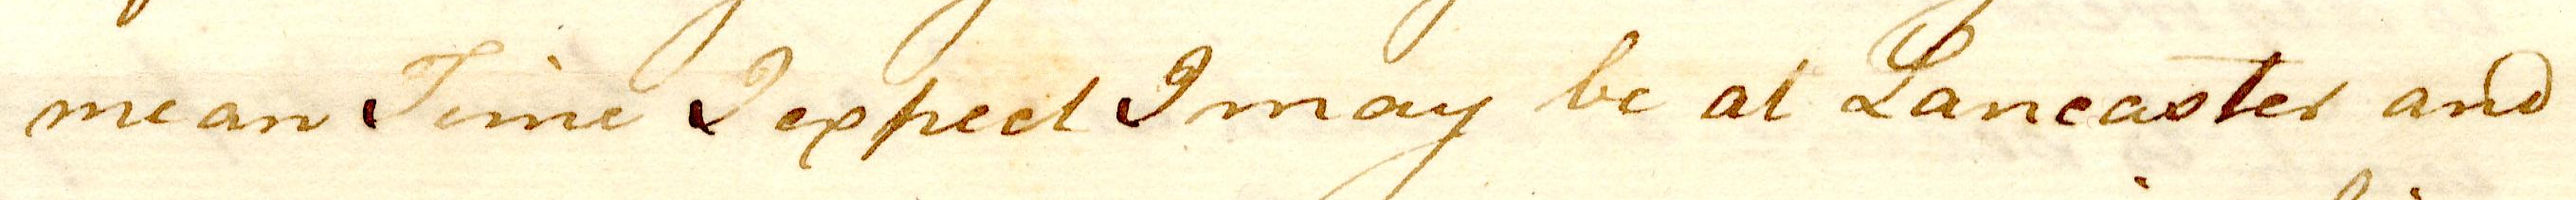mean Time I expect I may be at Lancaster and
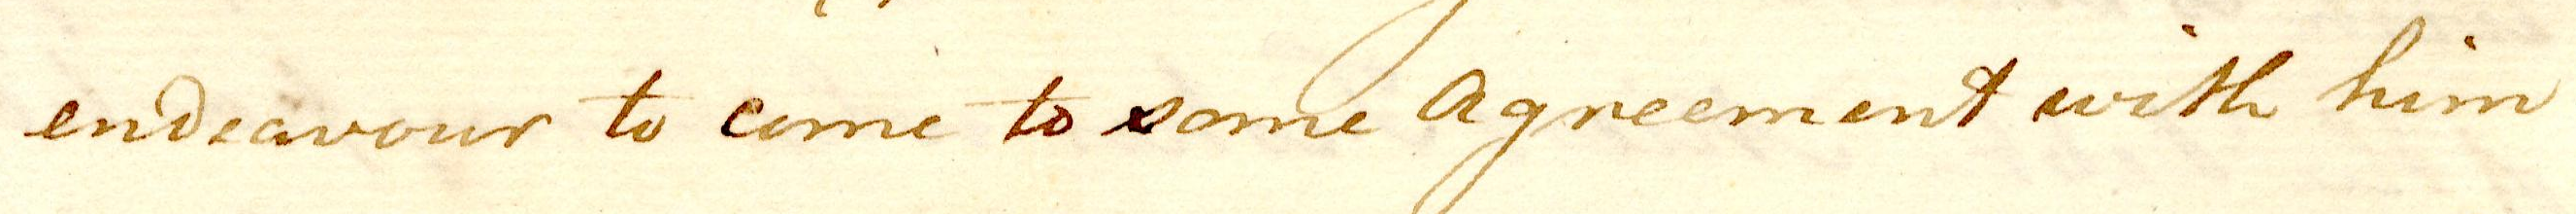endeavour to come to some Agreement with him
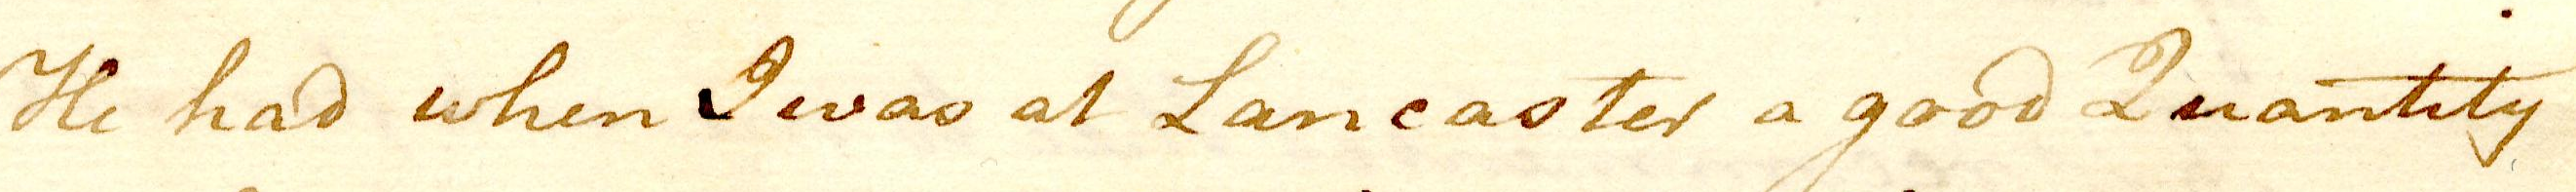He had when I was at Lancaster a good Quantity
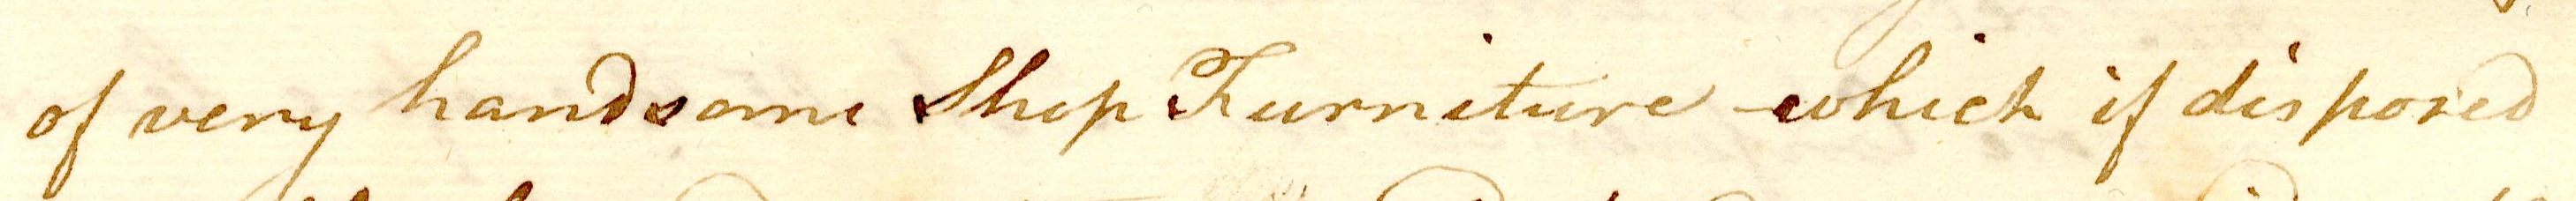of very handsome Shop Furniture, which if disposed
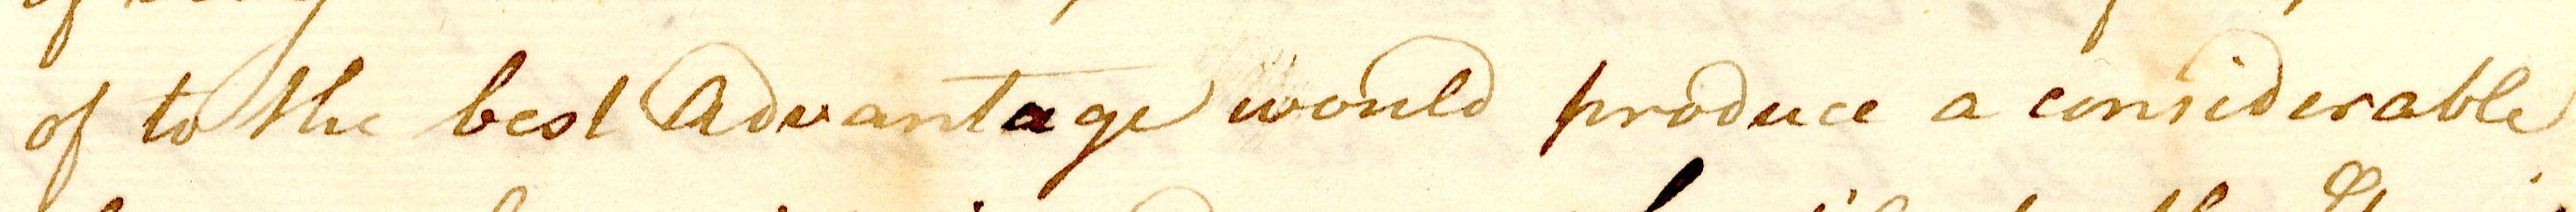of to the best Advantage would produce a considerable
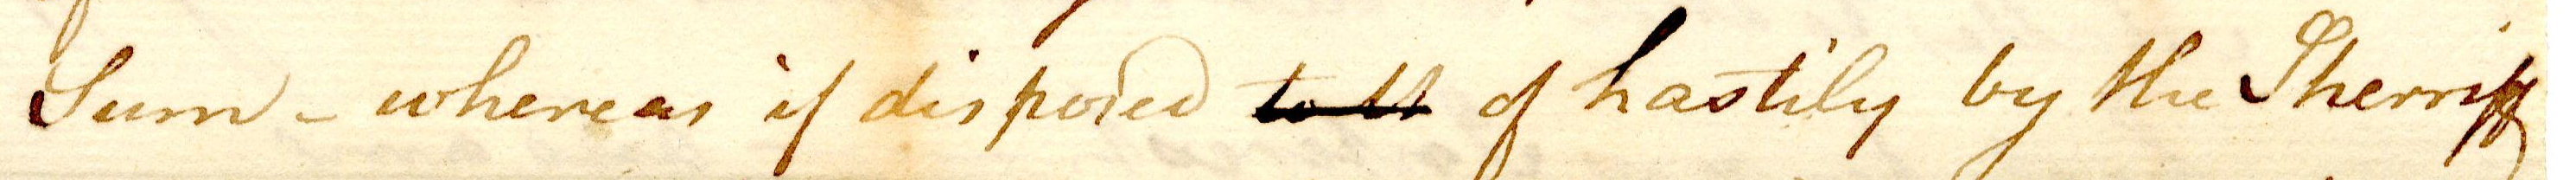Sum, whereas if disposed to it of hastily by the Sherriff
